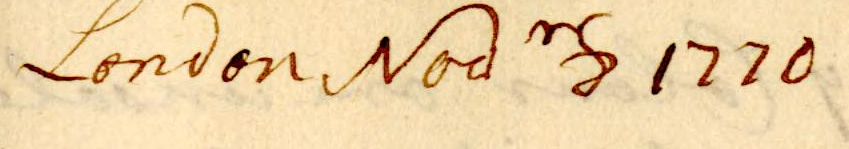London Nov^r 8 1770
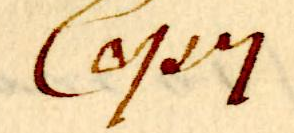Copy
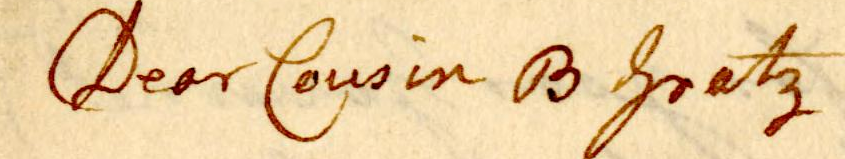Dear Cousin B Gratz
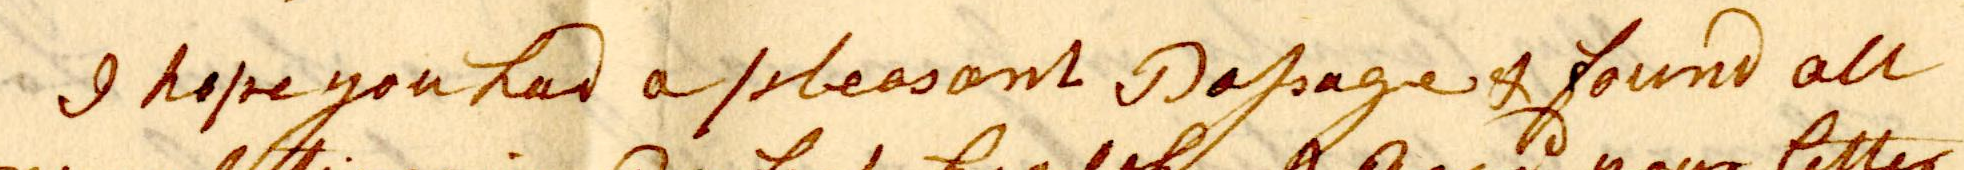I hope you had a pleasant passage & found all
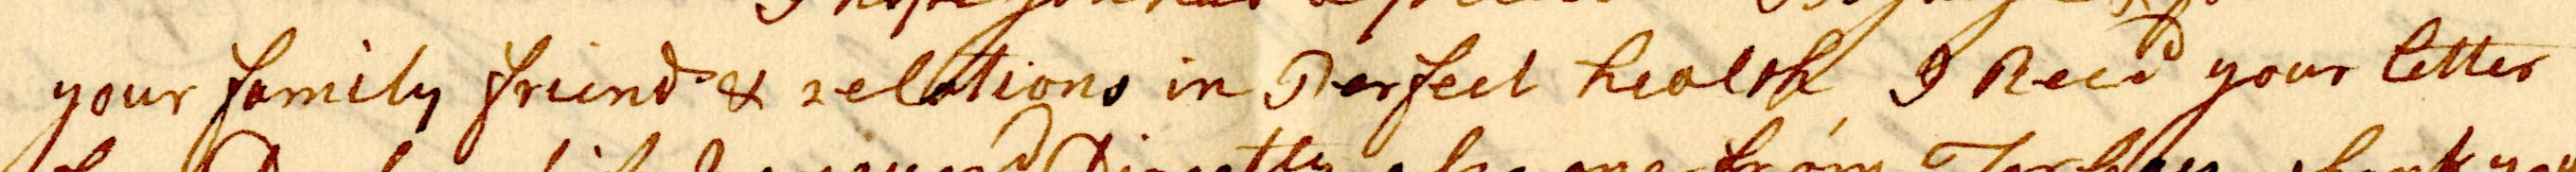your family friend & relations in perfect health I Need your letter
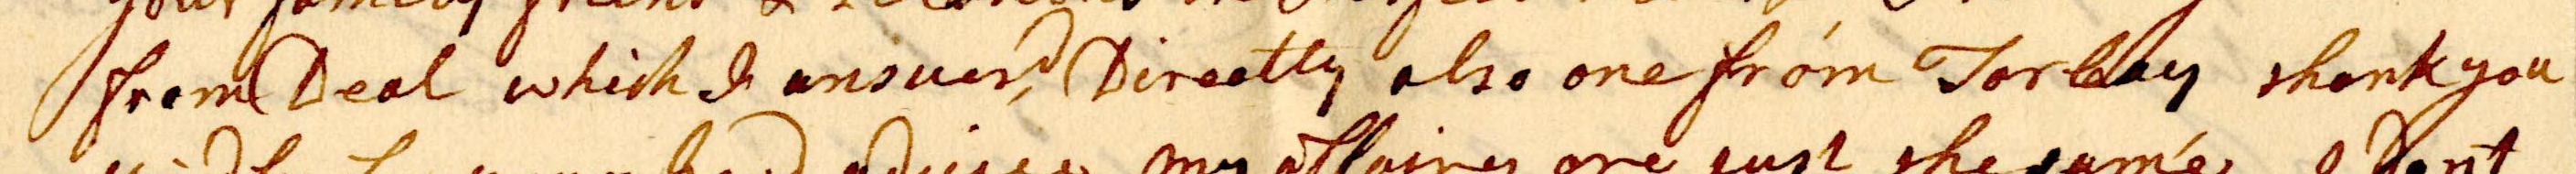from Deal which I answer^d Directly also one from Torlay thank you
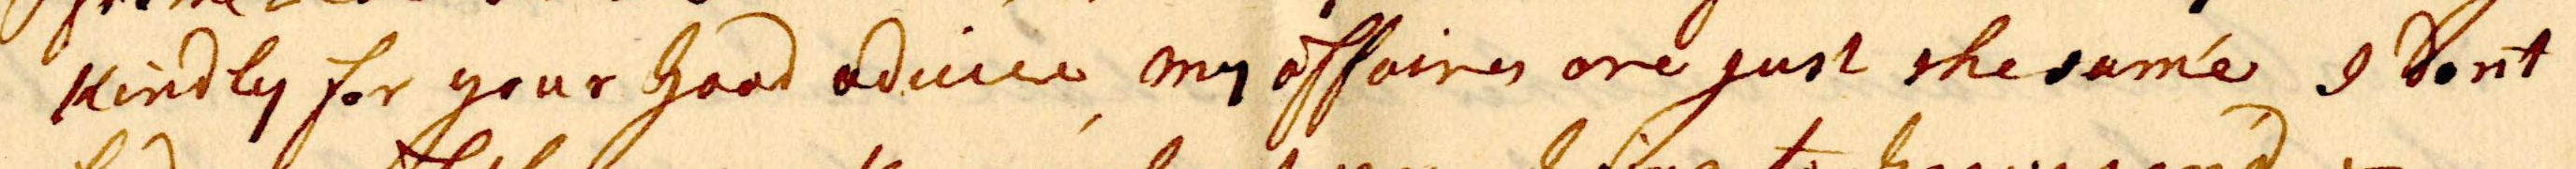kindly for your Good advice my affaires are just the same I dont
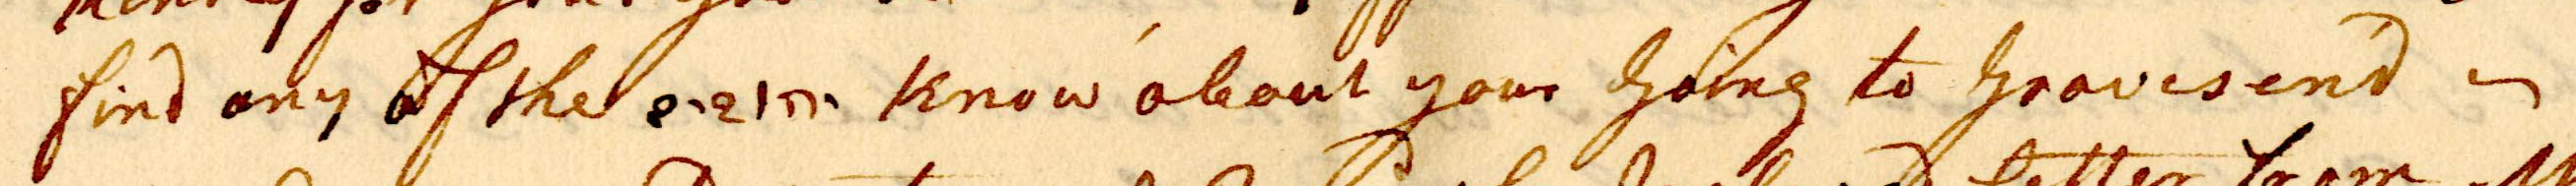find any of the [_____] know about your Going to Gravesend-
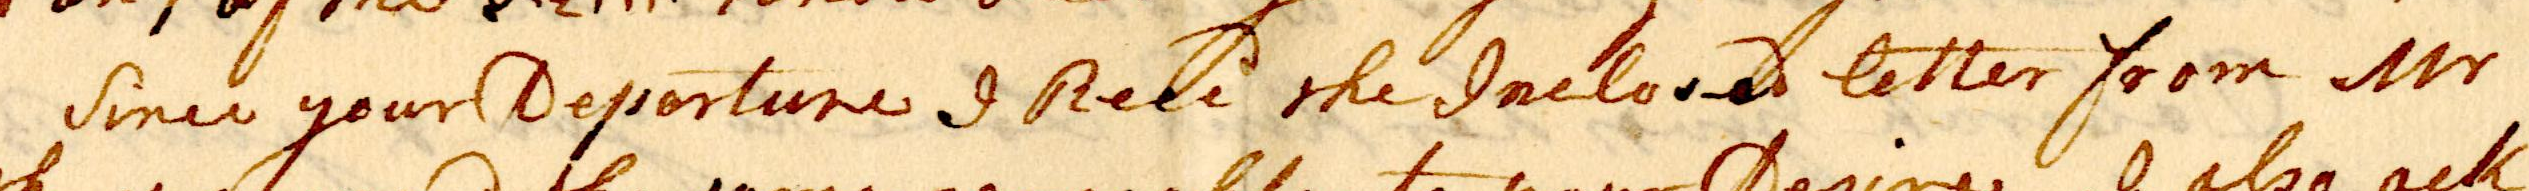Since your Departure I Rece^d the Inclosed letter from Mr.
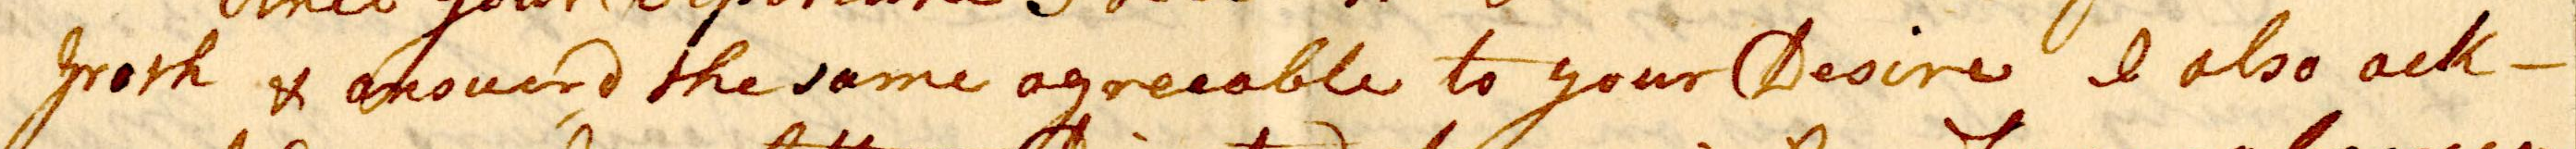Groth & answer'd the same agreeable to your Desire I also ack-
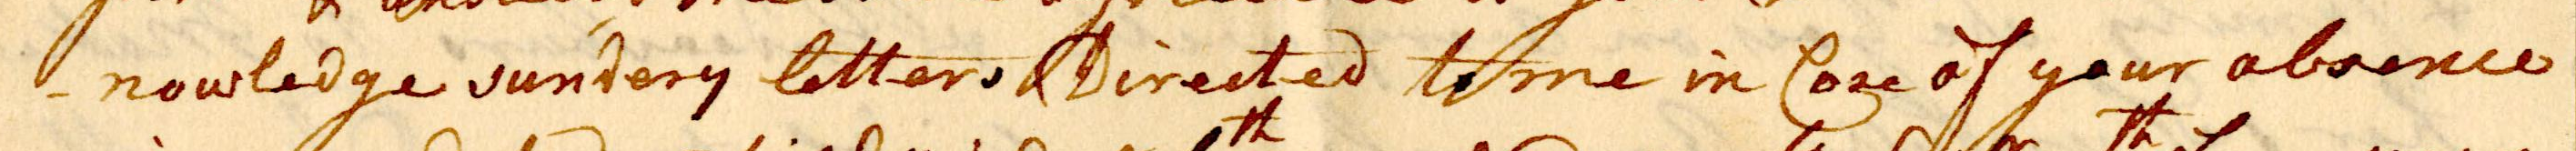-nowledge sundery letters Directed to me in Care of your absence
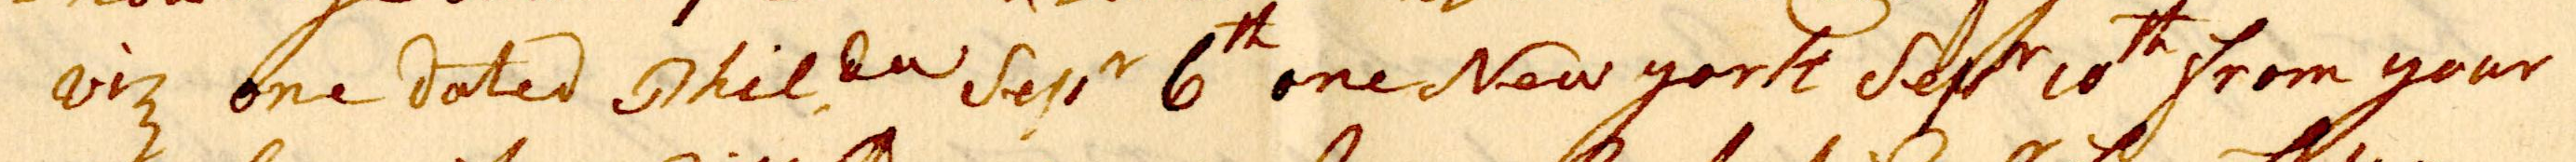viz one dated Phil^a Sep^r 6^th. one New York Sep^r 10^th from your
